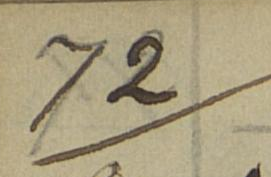72
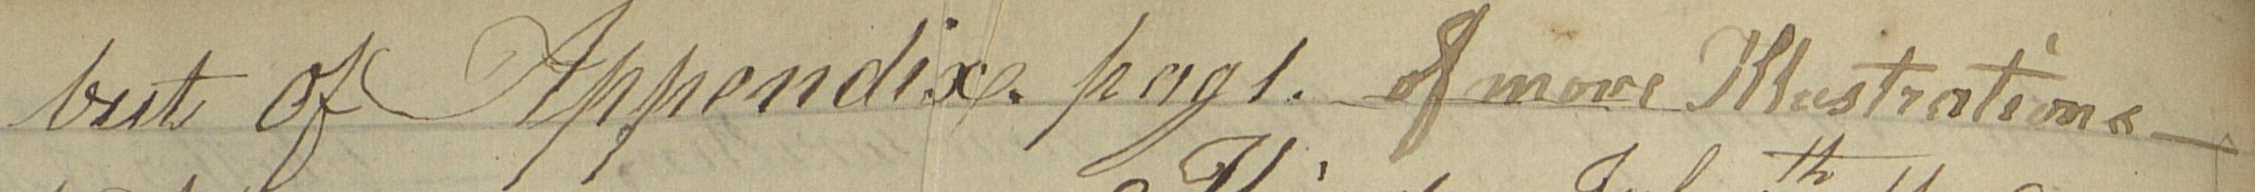but of Appendix pag 1. of more Illustrations
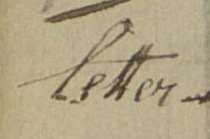letter
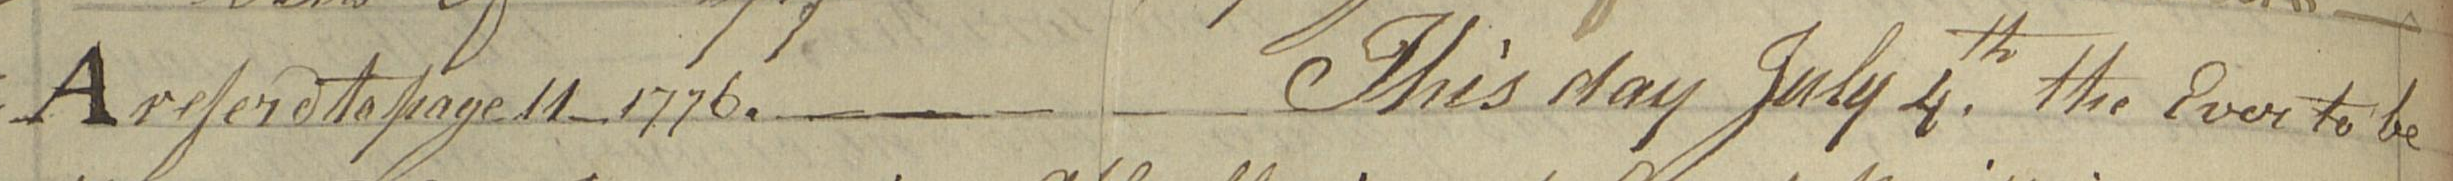A referd to page 14 1776. This day July 4^th the Ever to be
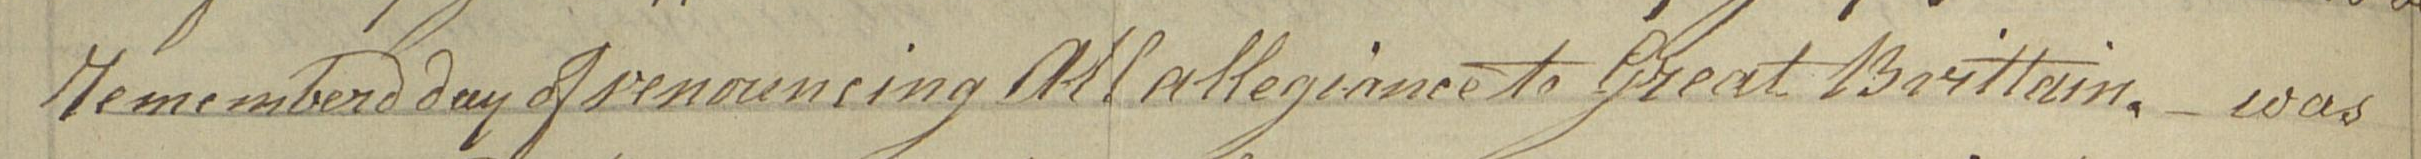Rememberd day of renouncing All allegiance to Great Brittain, was
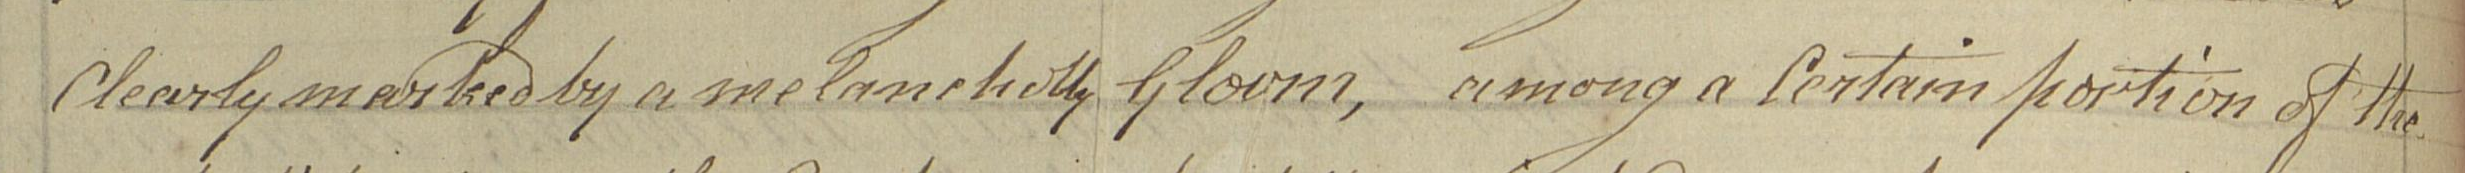Clearly marked by a melancholly Gloom, among a Certain portion of the
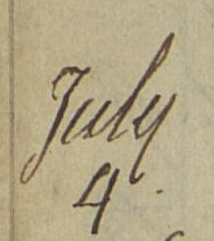July
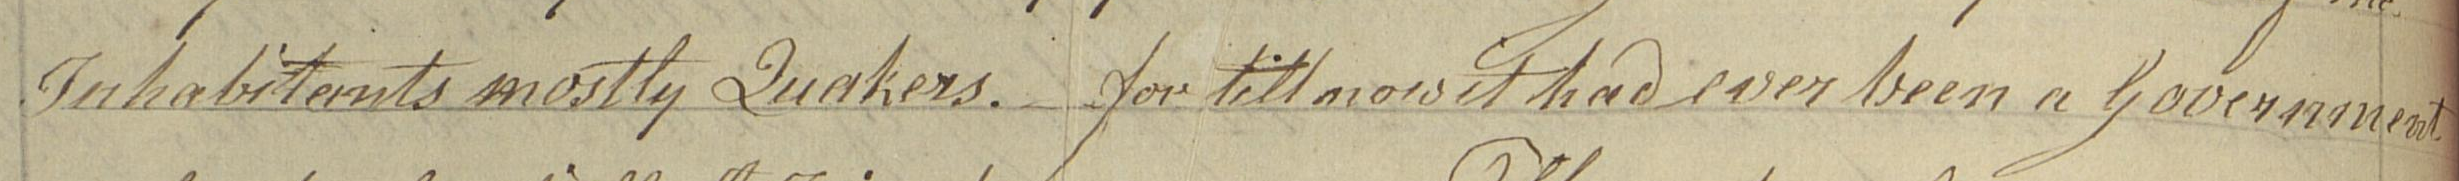Inhabitants mostly Quakers. for till now it had ever been a Government
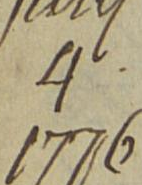4
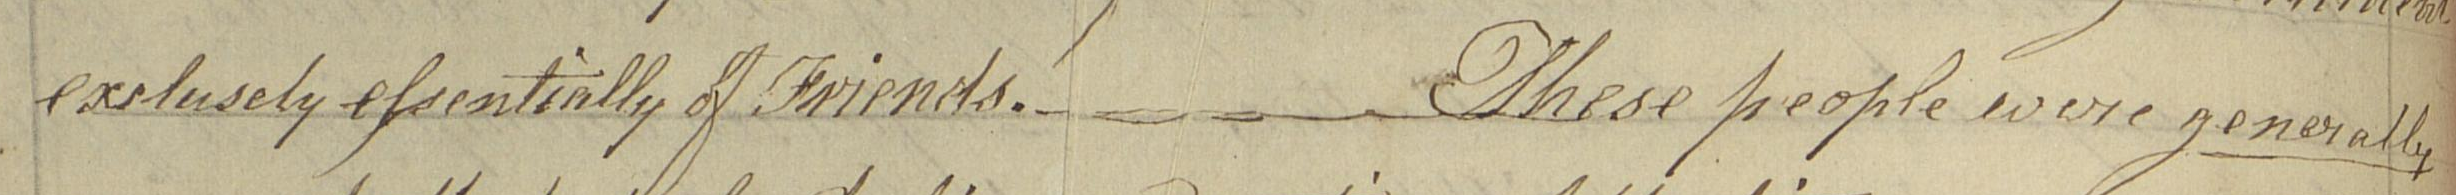exclusely essentially of Friends. These people were generally
